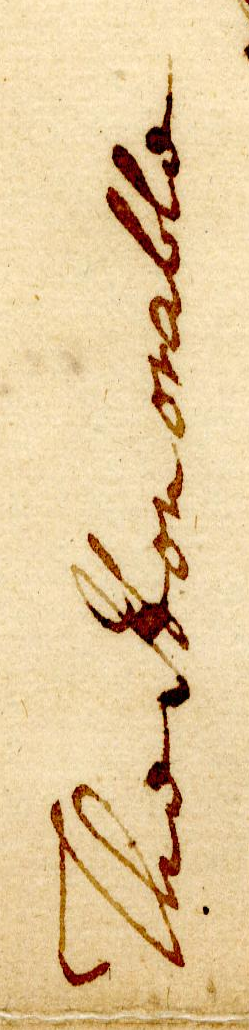The Honorable
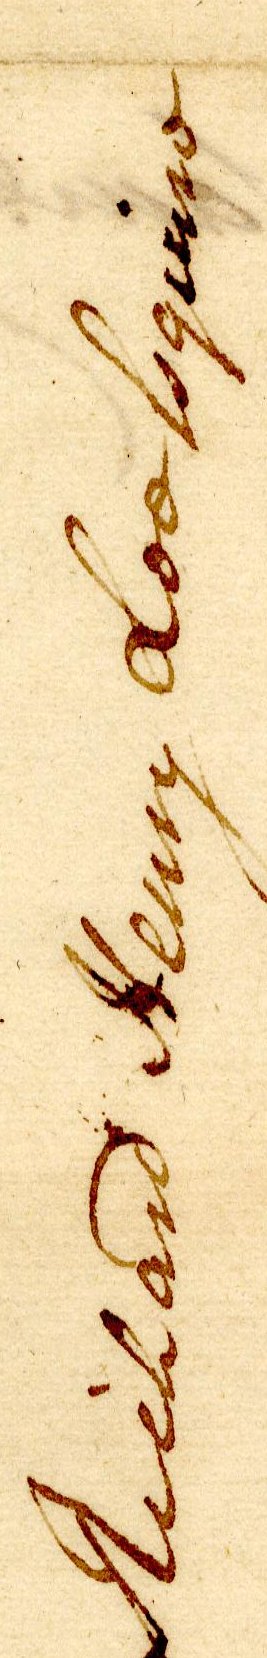Richard Henry Lee Esquire
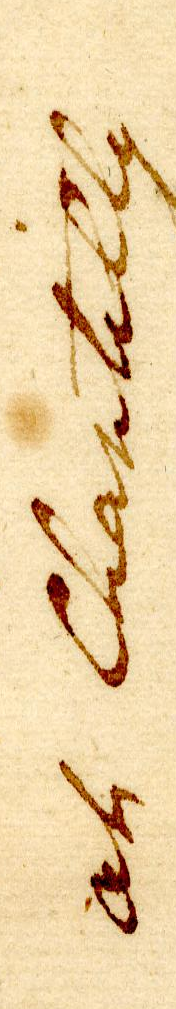at Chantilly
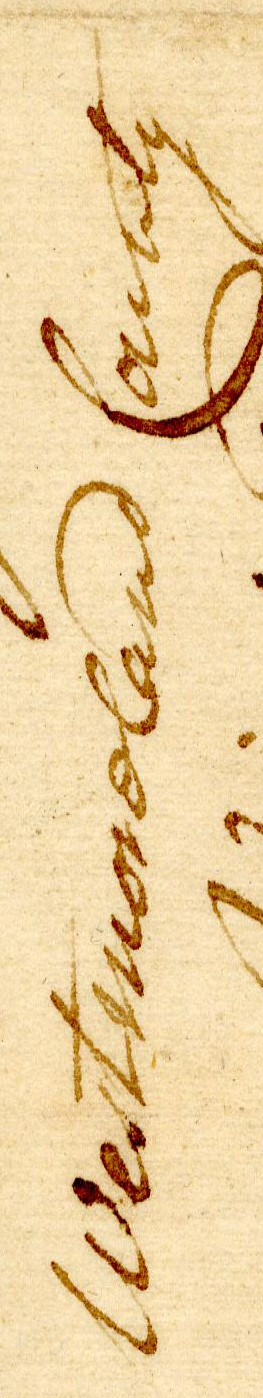Westmoreland County
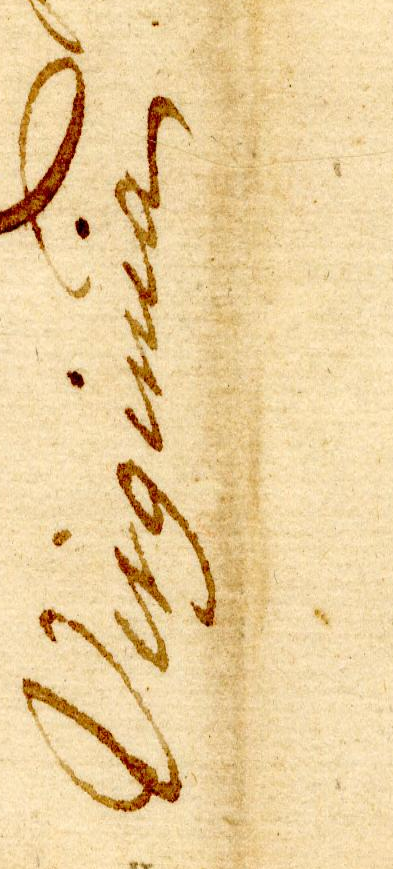Virginia
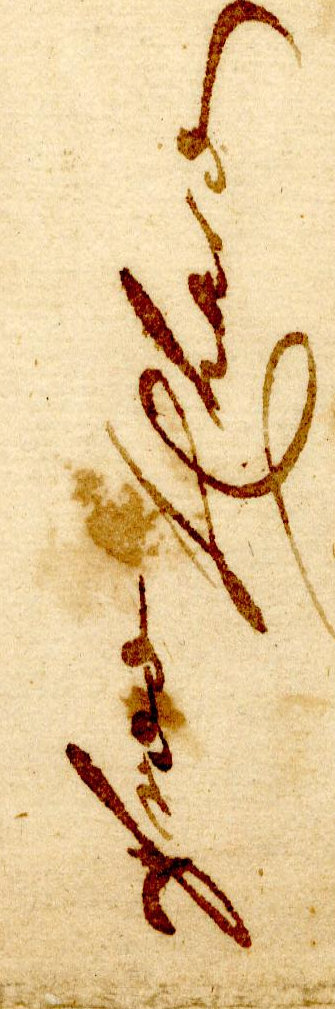From S Chase
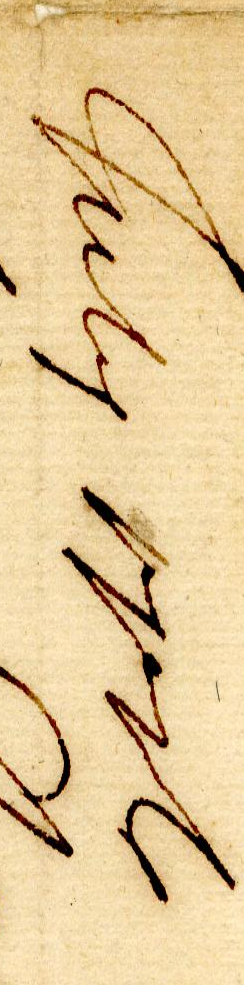July 1776
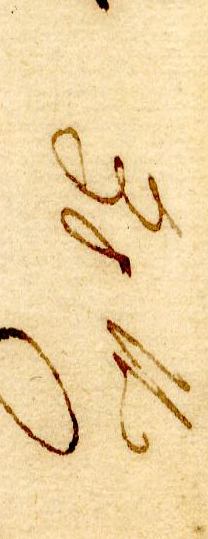30^th
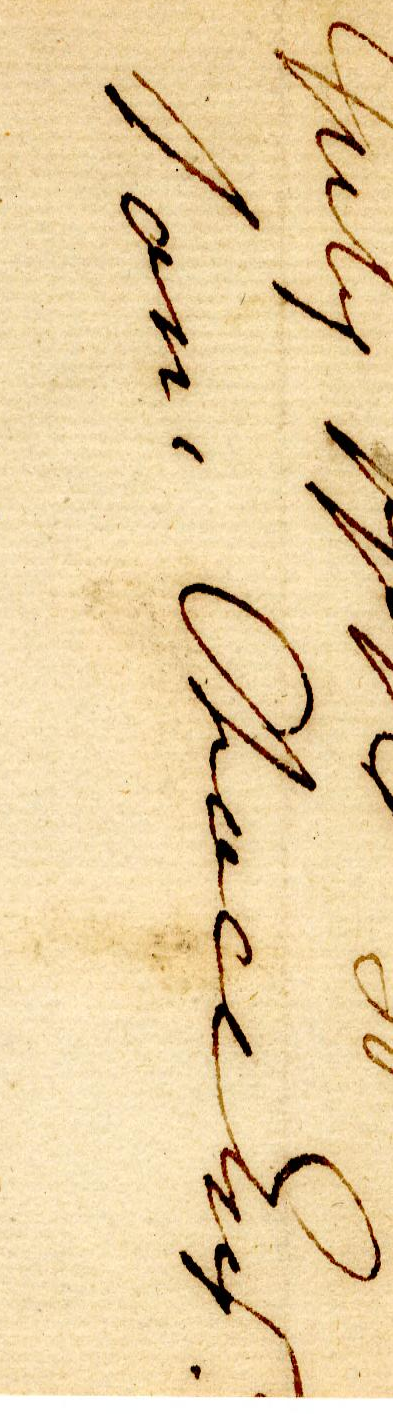Sam Chase Esq^r
